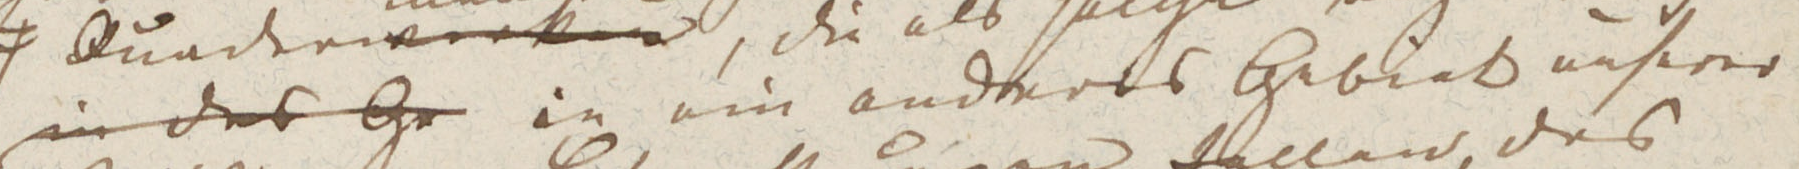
in das Ge in ein anderes Gebiet unserer
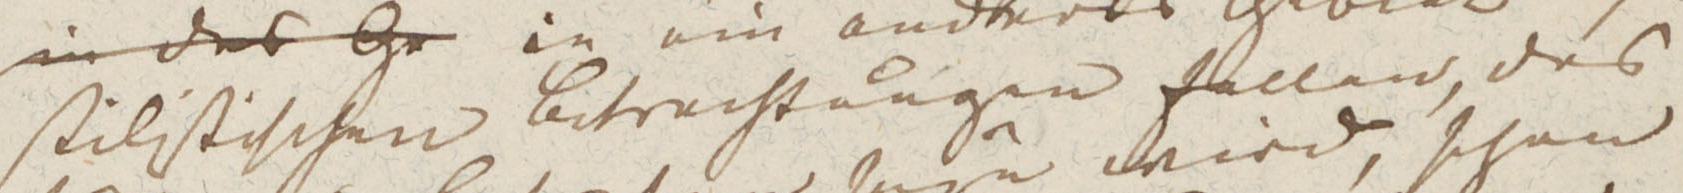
stilistischen Betrachtungen fallen, das
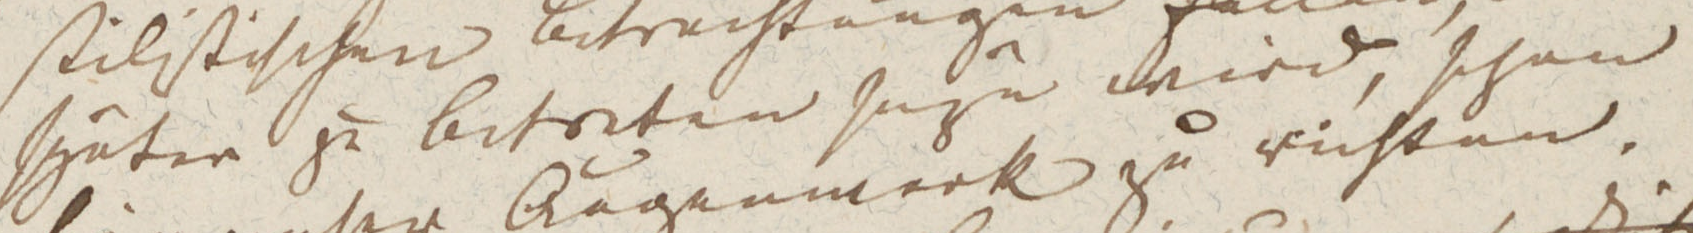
später zu betreten seyn wird, schon
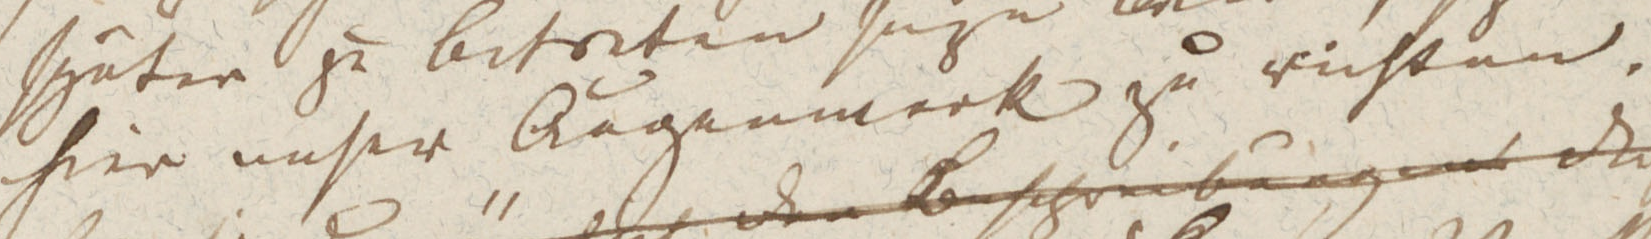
hier unser Augenmerk zu richten.
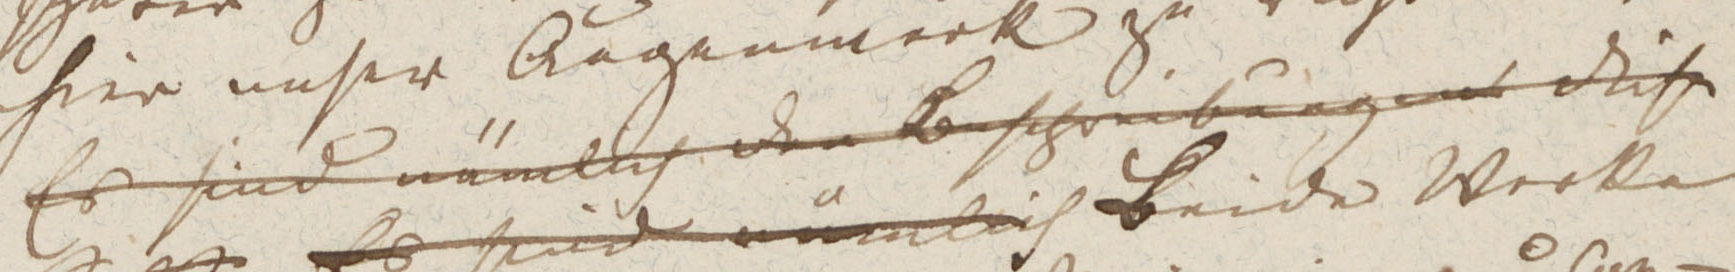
Es sind nämlich den Beschreibungen diese
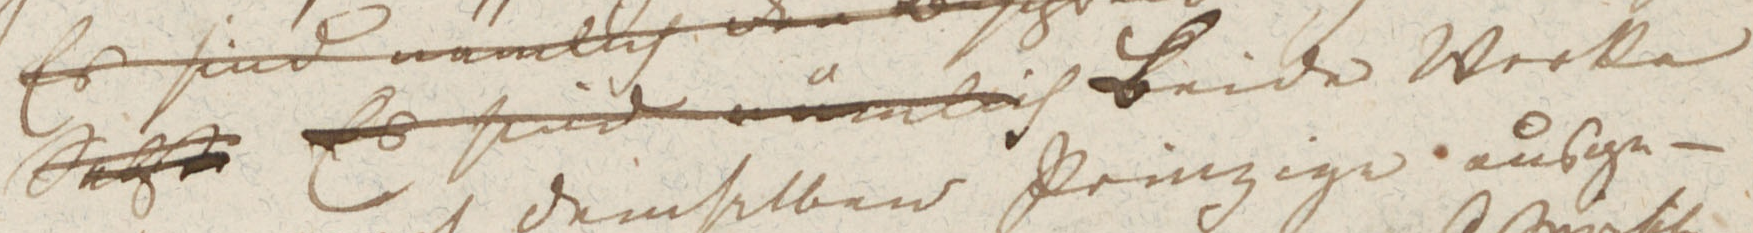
Sebst Es sind nämlich bBeide Werke
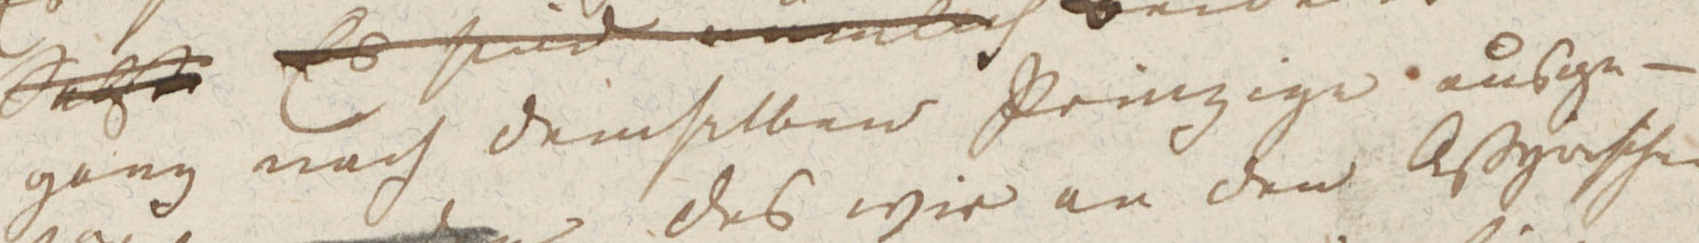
ganz nach demselben Prinzipe ausge-
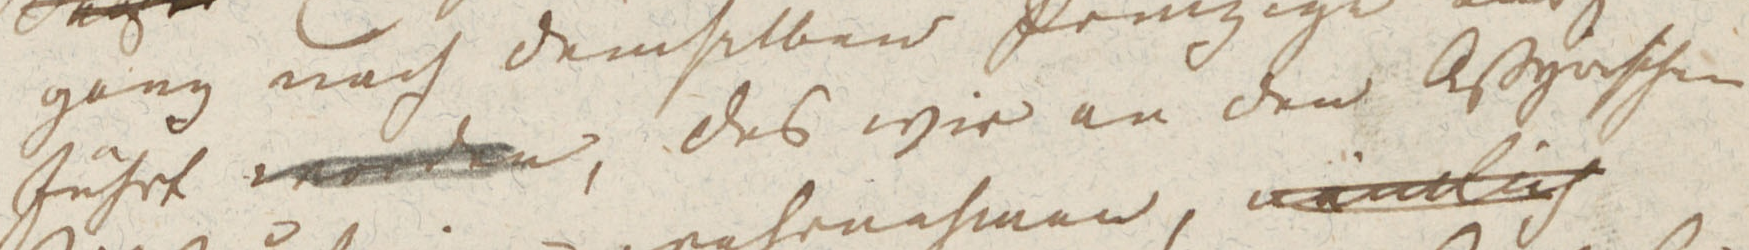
führt worden, das wir an den Assyrischen
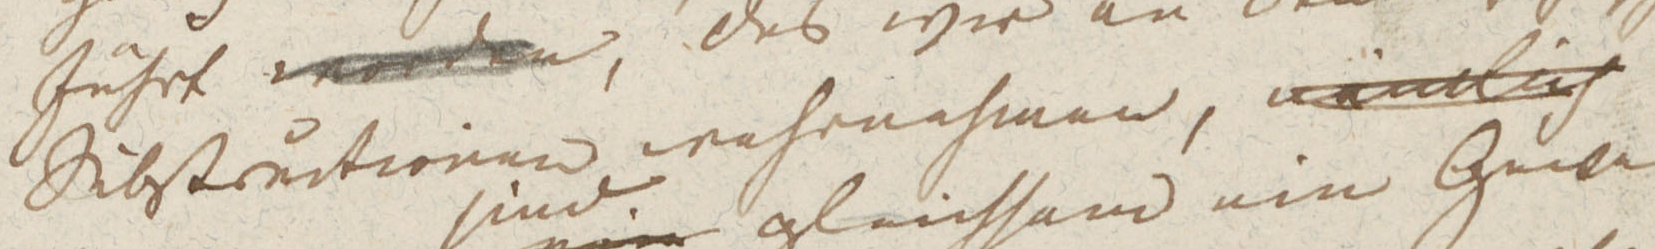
Substructionen wahrnehmen, nämlich
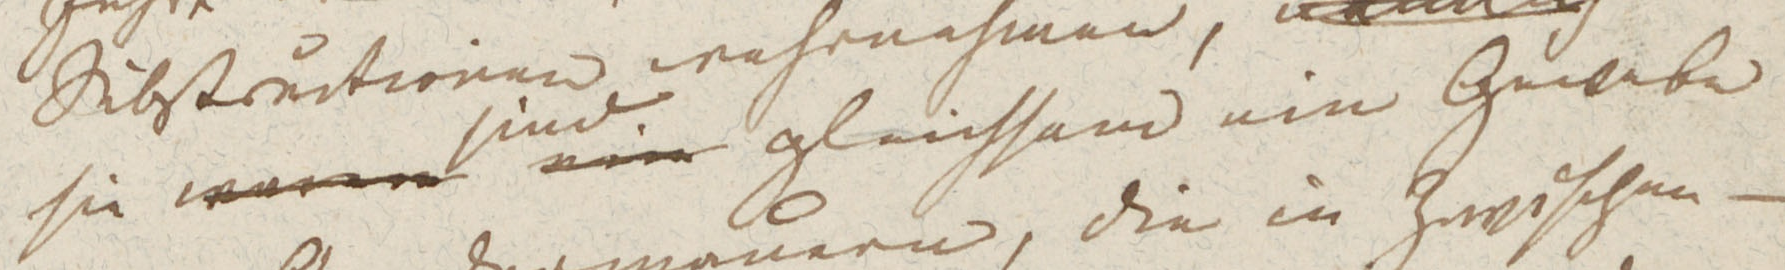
sie waren sind ein gleichsam ein Gewebe
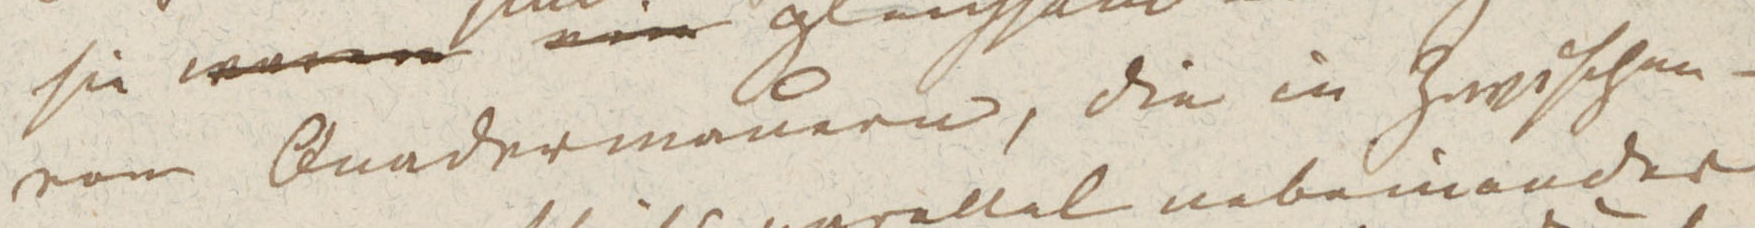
von Quadermauern, die in Zwischen-
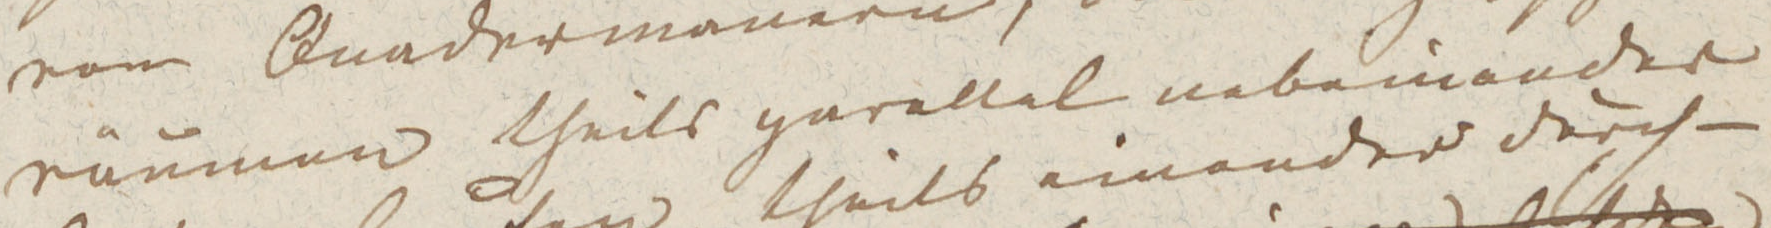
räumen theils parallel nebeinander
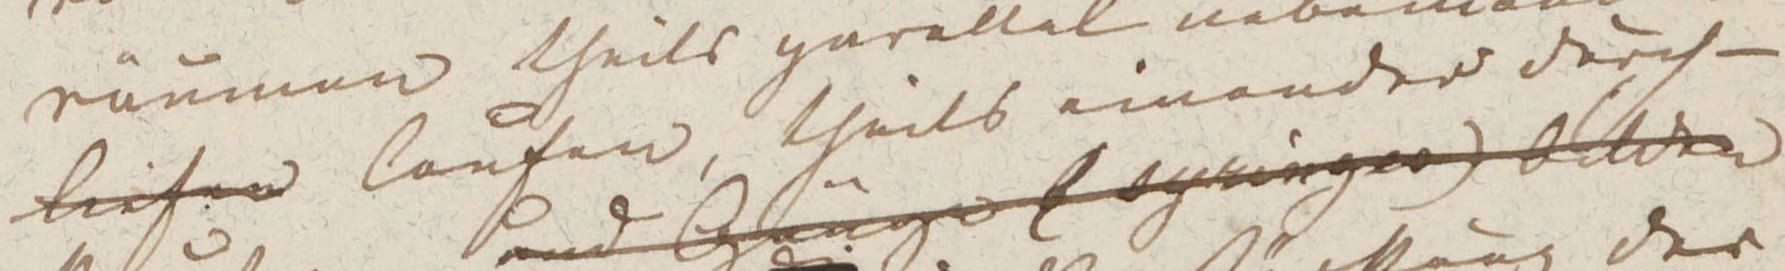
liefen laufen, theils einander durch-
